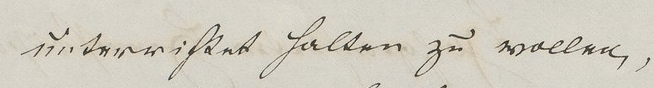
unterrichtet halten zu wollen,
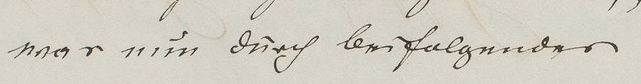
was nun durch beifolgendes
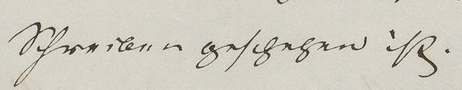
Schreiben geschehen ist. –
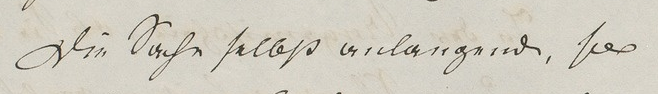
Die Sache selbst anlangend, so
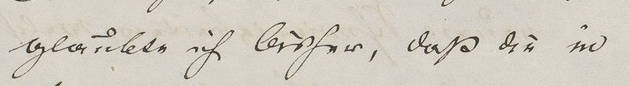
glaubte ich bisher, daß die in
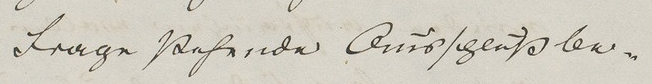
Frage stehende Ausschlußbe-
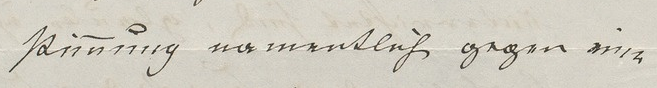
stimmung namentlich gegen eine
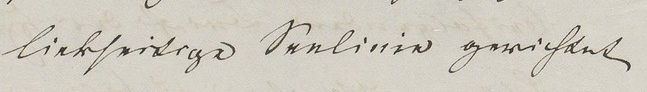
linkseitige Seelinie gerichtet
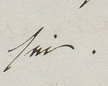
sei.
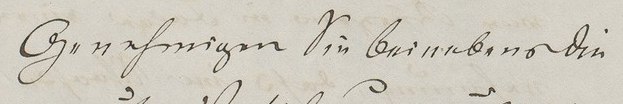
Genehmigen Sie beinebens die
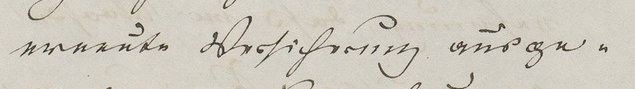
erneute Versicherung ausge-
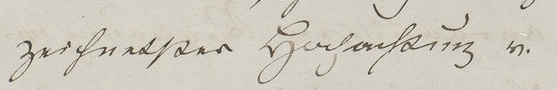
zeichnetster Hochachtung v.
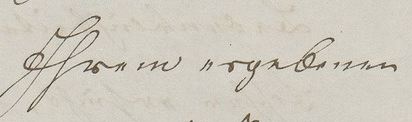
Ihrem ergebenen
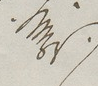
69.
